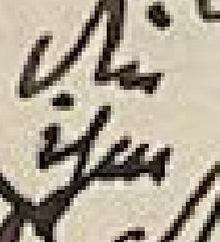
ihm
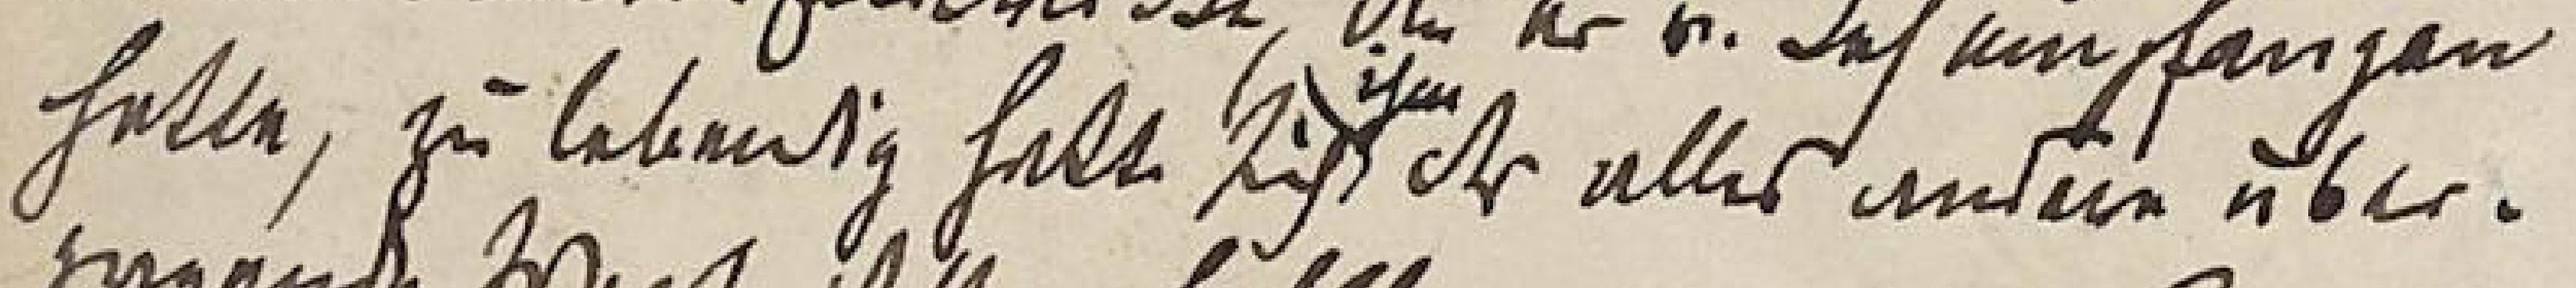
hatte, zu leben hatte sich dr alles andere über¬
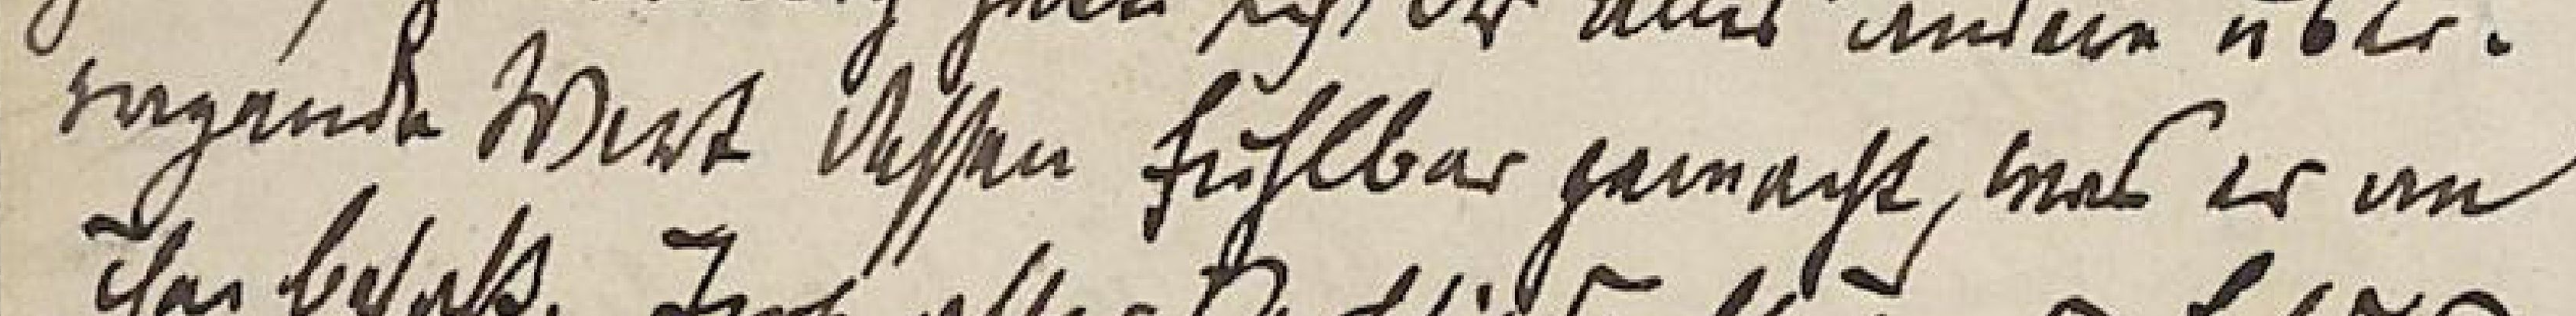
ragende Wert dessen fühlbar gemacht, was er an
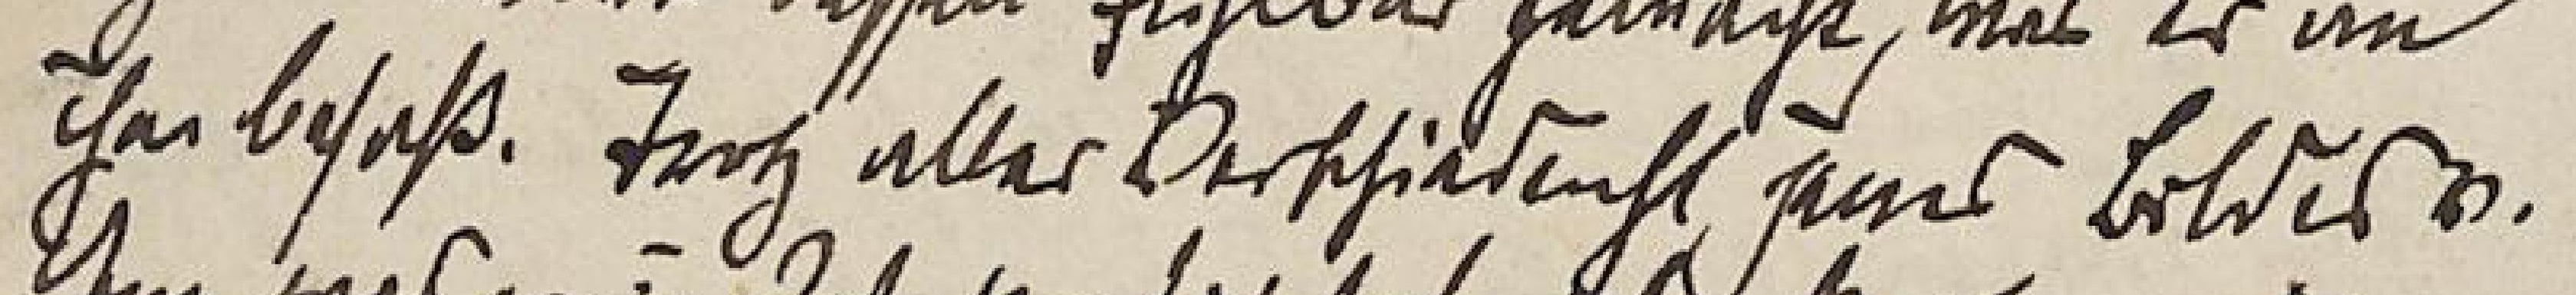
ihm besaß. Trotz aller Verschiedenht. jenes Bildes v.
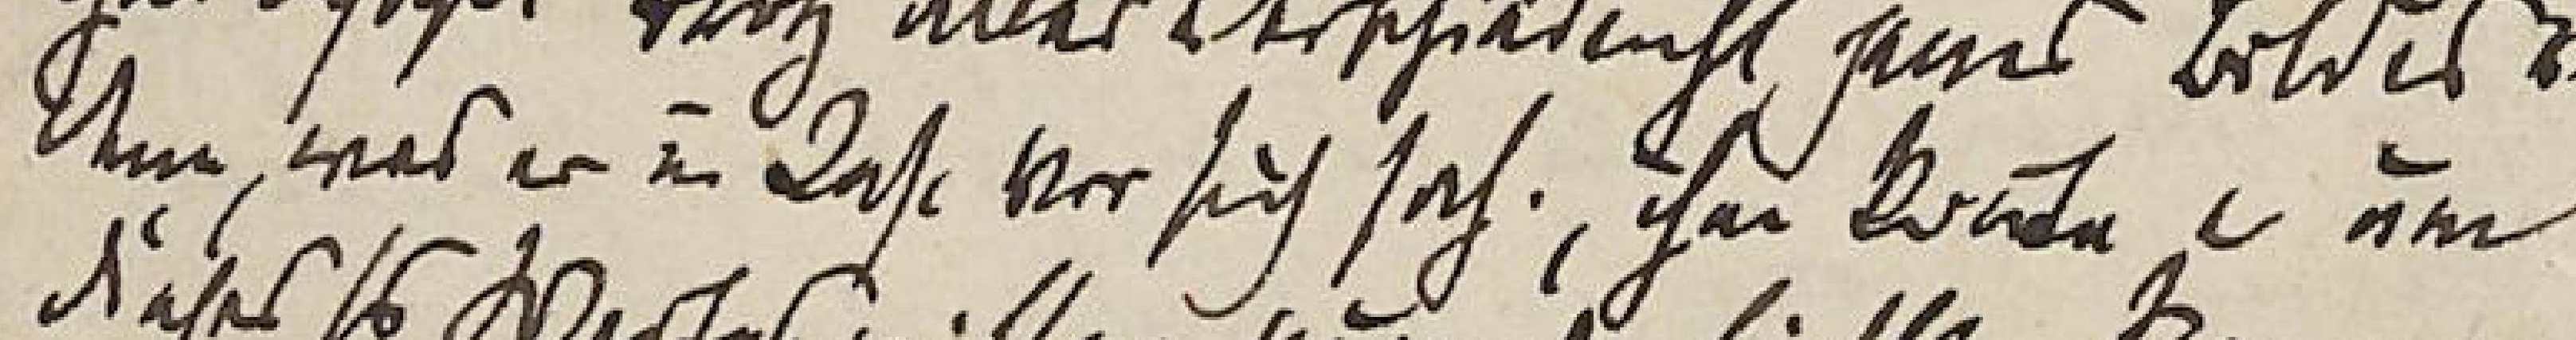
dem, was er in Jes. vor sich sah, ihm konte er um
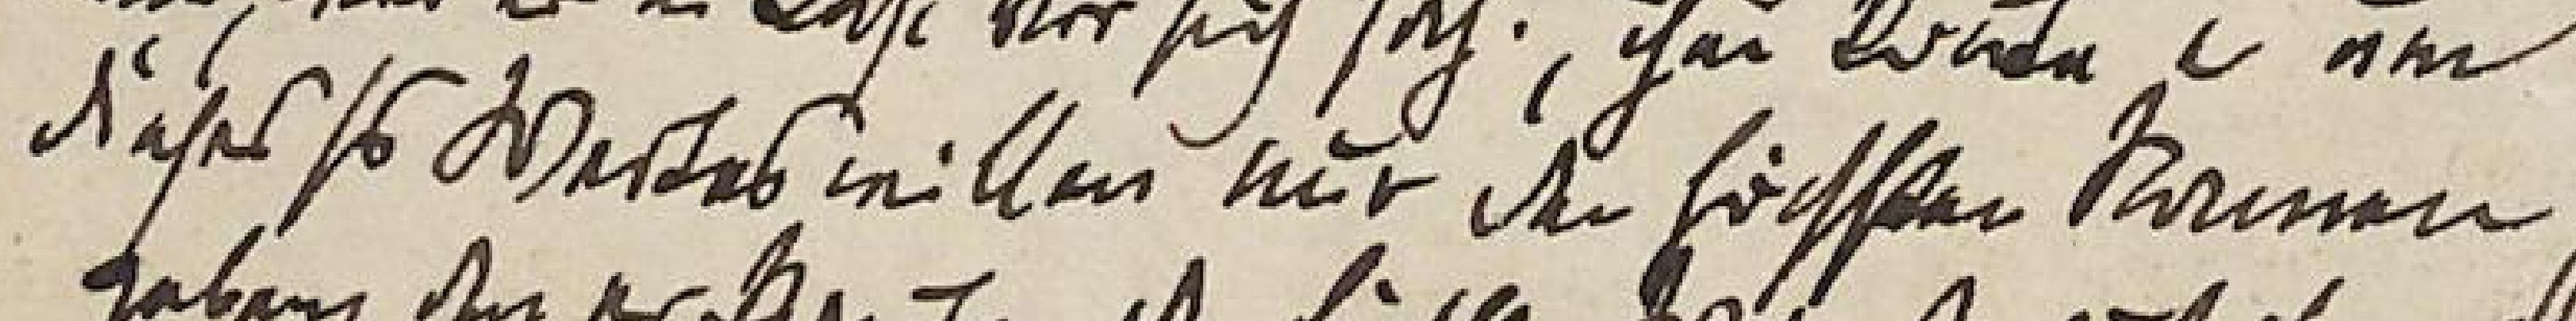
dieses ss Wertes willen nur den höchsten Namen
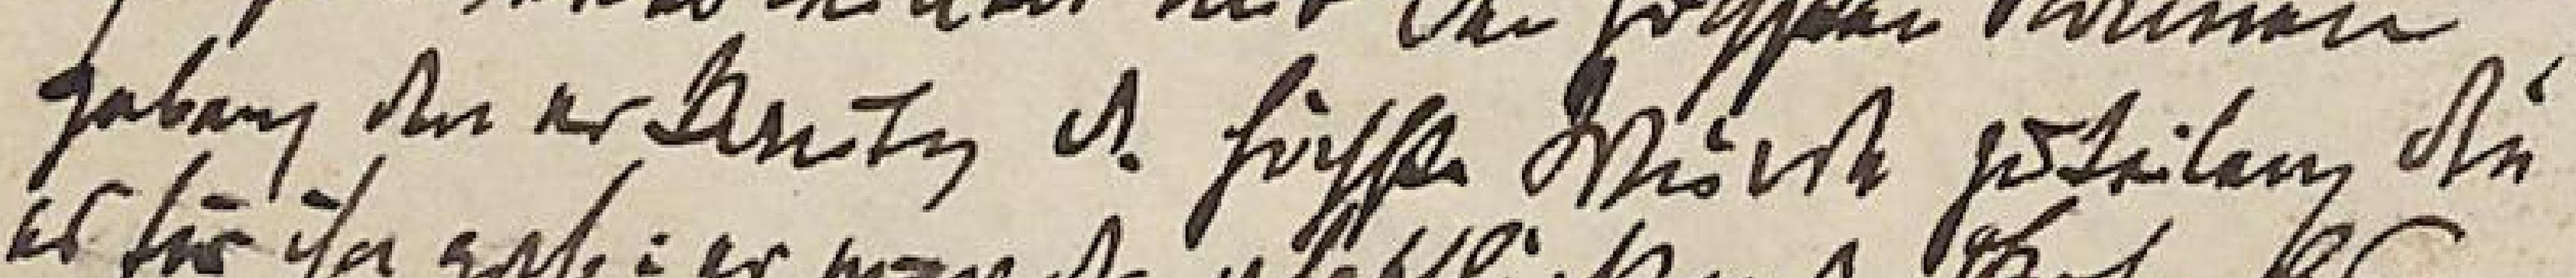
geben, den er kante, d. höchste Würde zuteilen, die
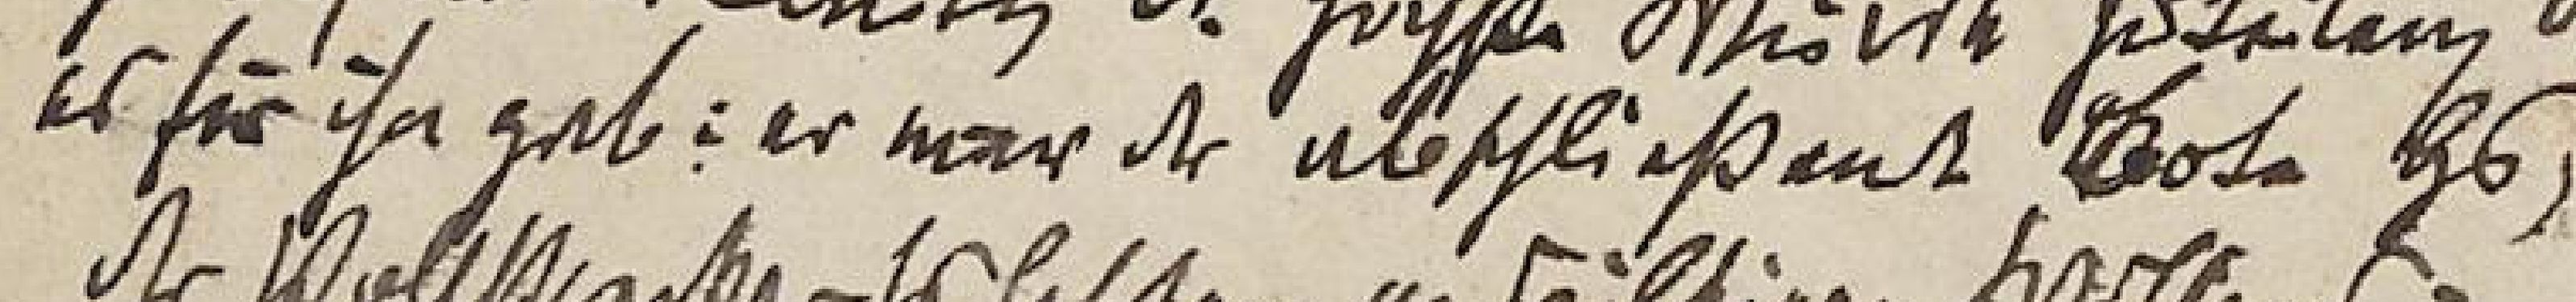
es für ihn gab: er war dr abschließende Bote Gs,
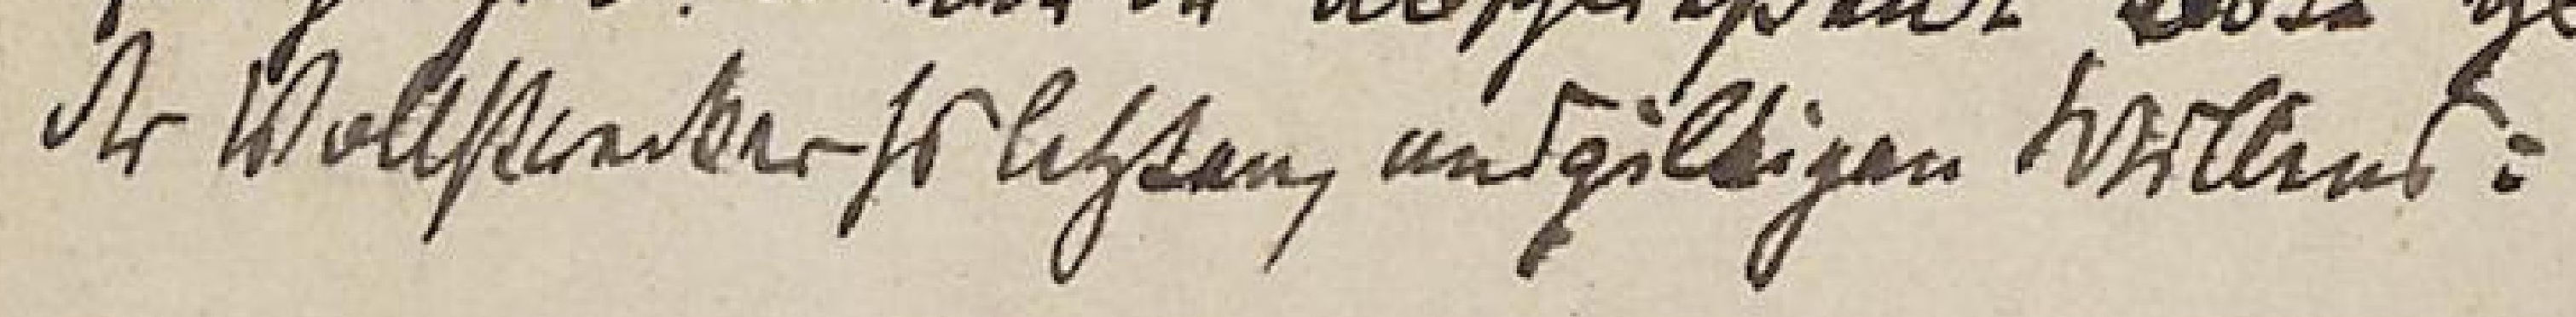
dr Vollstreker ss letzten, endgültigen Willens:
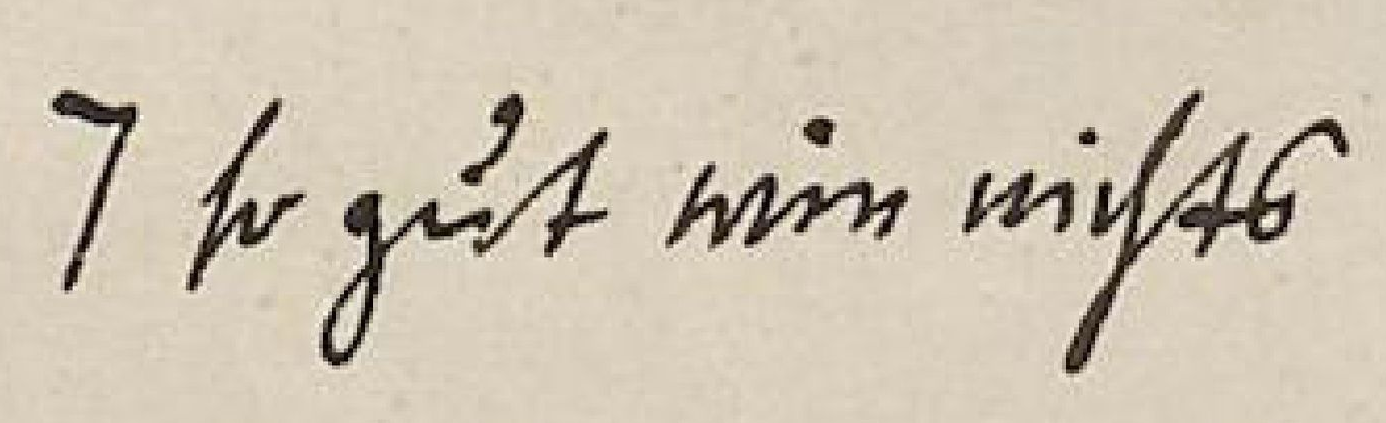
] so gut wie nichts
